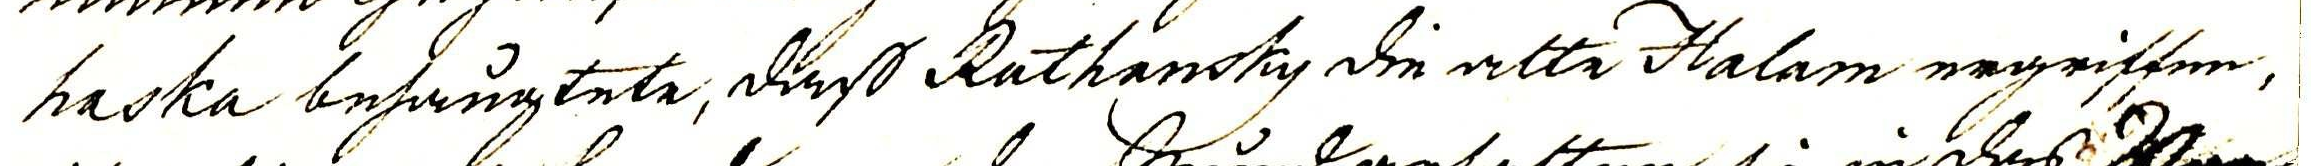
haska behauptete, daß Rathausky die alte Halam ergriffen,
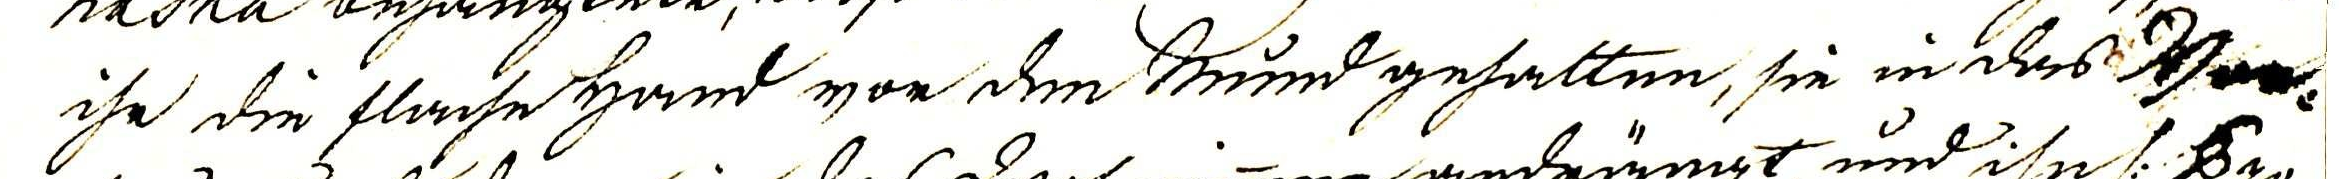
ihr die flache Hand vor den Mund gehalten, sie in das Vor¬
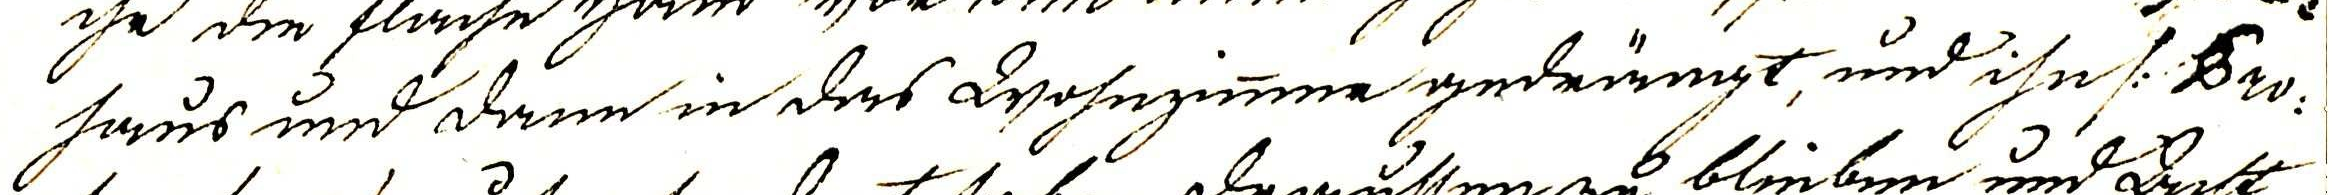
haus und dann in das Wohnzimmer gedrängt, und ihn (Pro¬
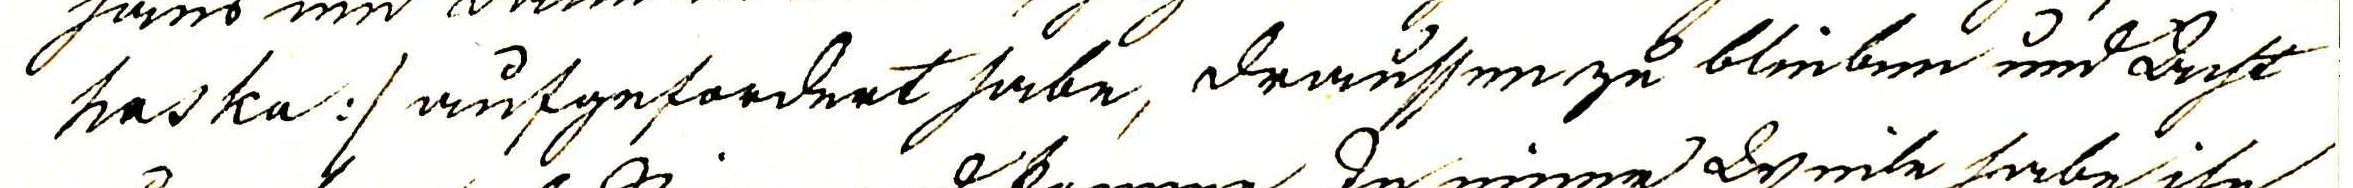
haska) aufgefordert habe, draussen zu bleiben und Acht
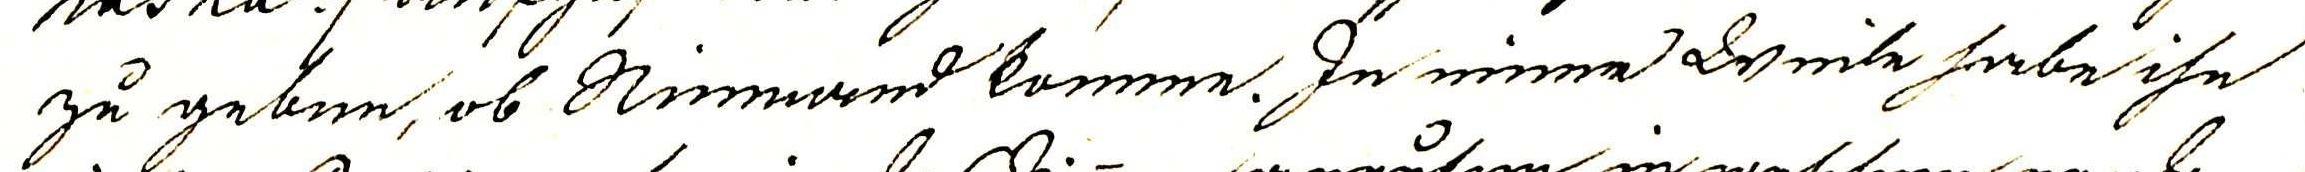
zu geben, ob Neimand komme. In einer Weile habe ihn
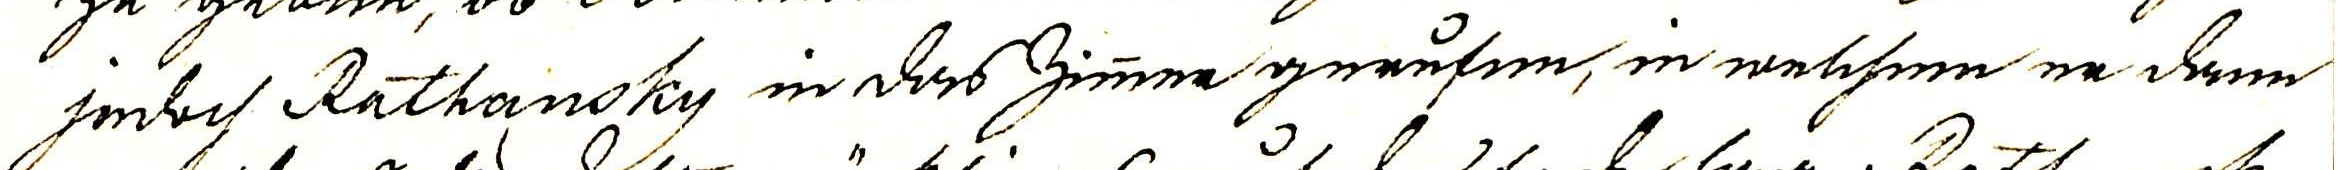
jedoch Rathausky in das Zimmer gerufen, in welchem er dann
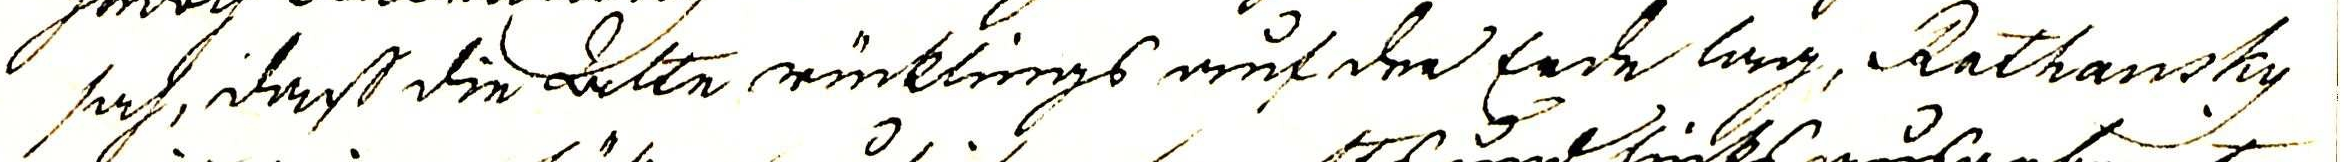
sah, daß die Alte rücklings auf der Erde lag, Rathausky
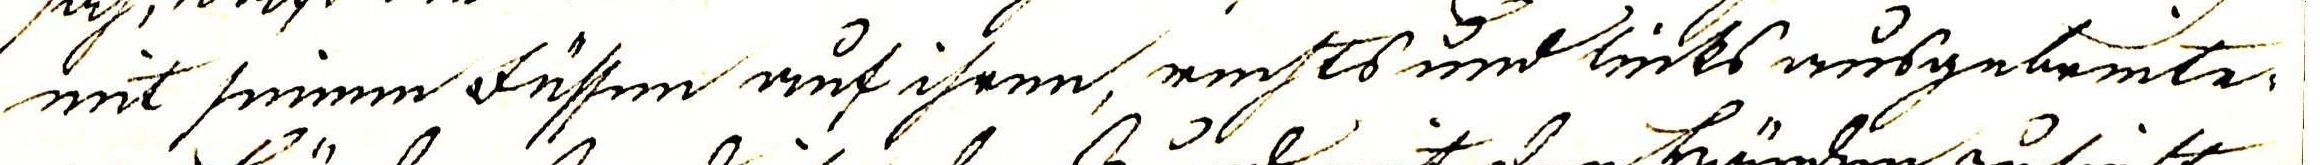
mit seinem Füssen auf ihren, rechts und links ausgebreite¬
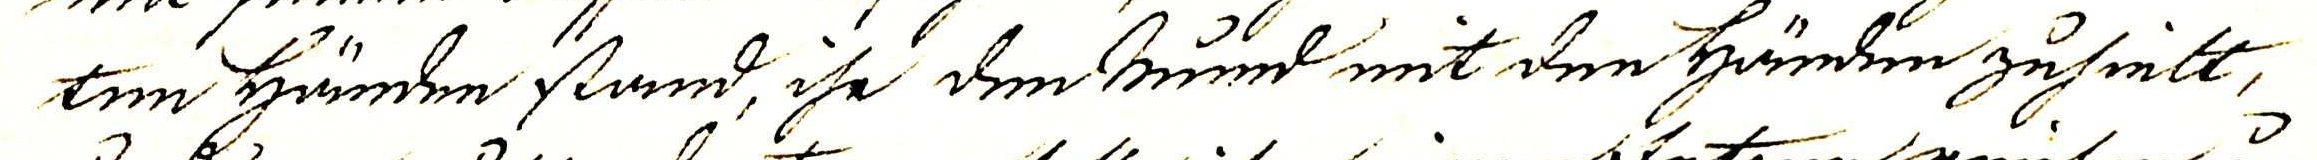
ten Händen stand, ihr dem Mund mit den Händen zuhielt,
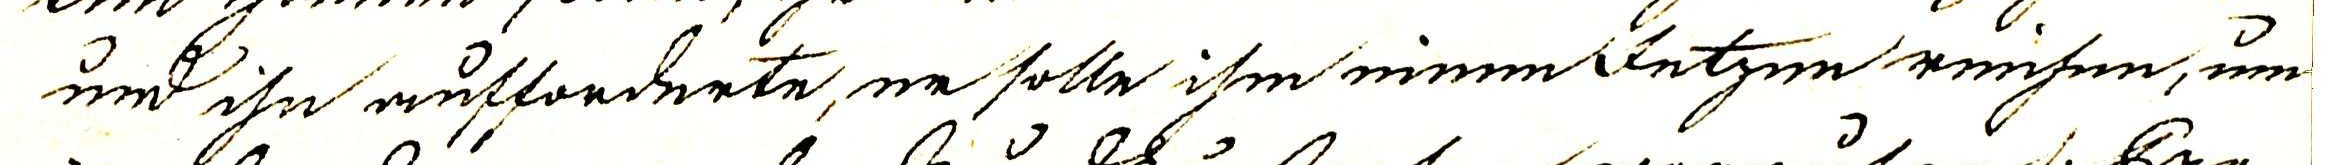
und ihn aufforderte, er solle ihm einen Fetzen reichen, um
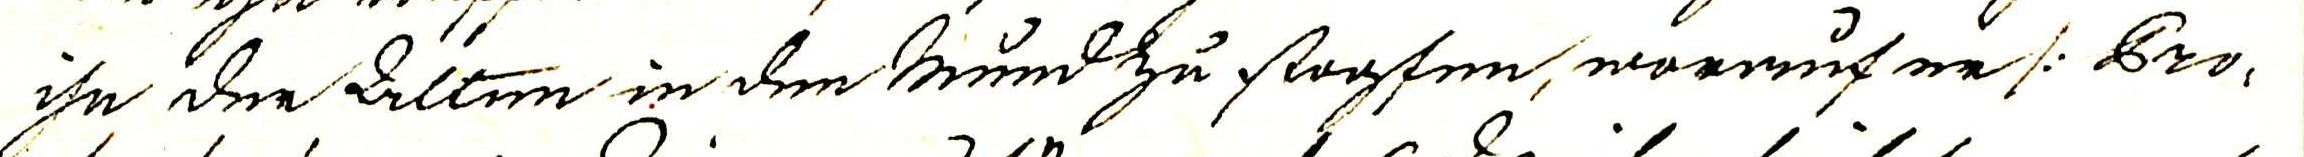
ihn der Alten in den Mund zu stopfen, worauf er (Pro¬
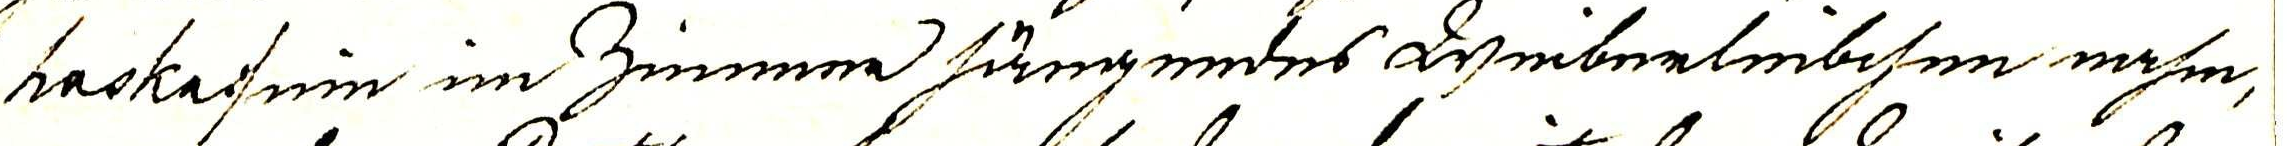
haska) ein im Zimmer hängendes Weiberleibchen nahm,
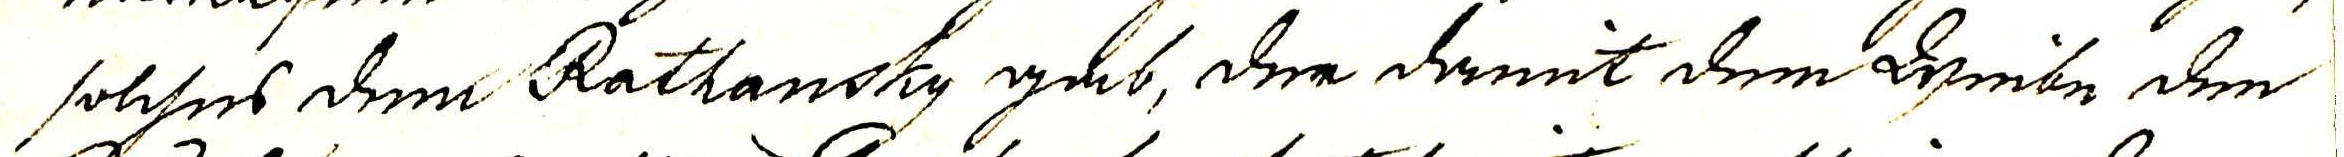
solches dem Rathausky gab, der damit dem Weibe den
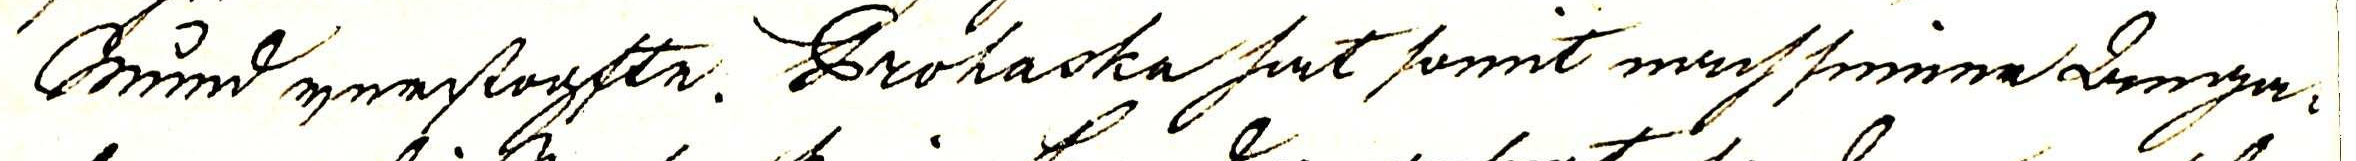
Mund verstopfte. Prohaska hat somit nach seiner Anga¬
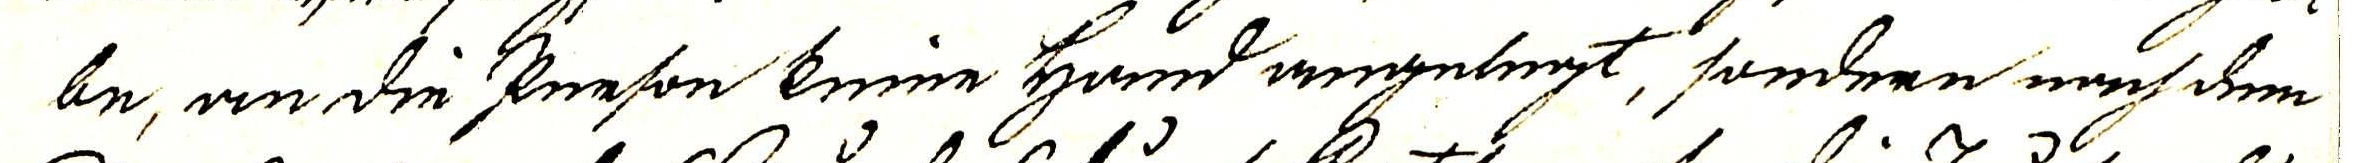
be, an die Person keine Hand angelegt, sondern nach dem
